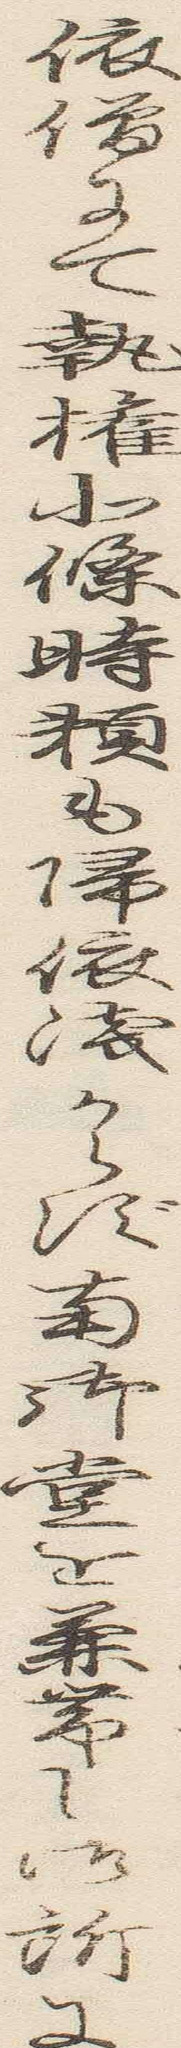依僧にて執権北條時頼も帰依淺からず南御堂を兼帯し御所に
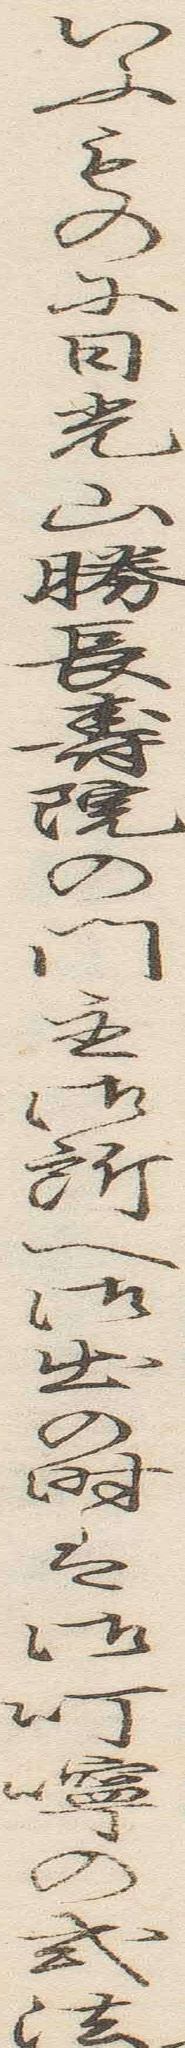いふものに日光山勝長壽院の門主御所へ御出の时は御叮嚀の式法
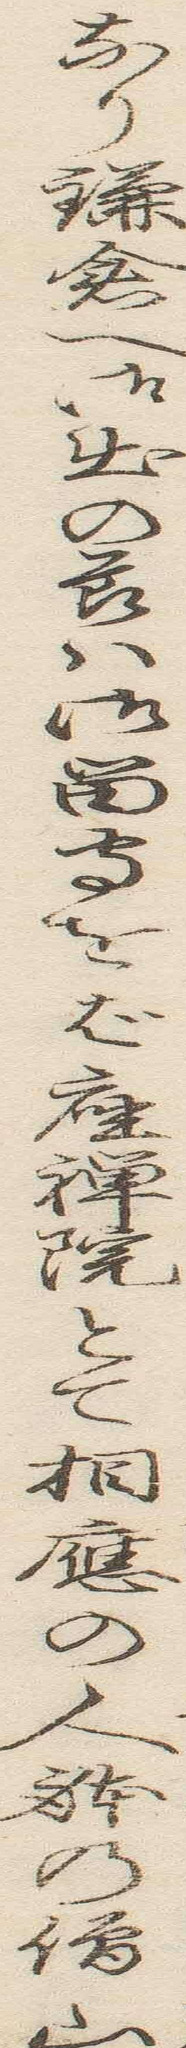なり鎌倉へ御出の節は御畄守をば座禅院とて相應の人躰の僧山
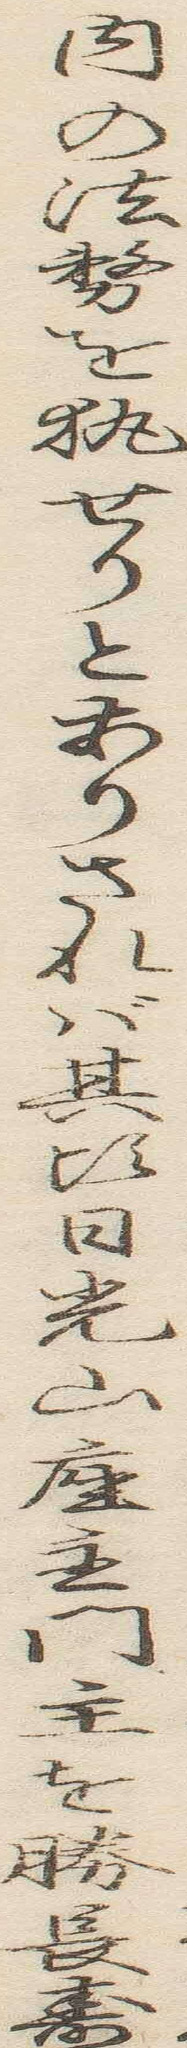内の法務を執せりとありされば其頃日光山座主門主を勝長壽
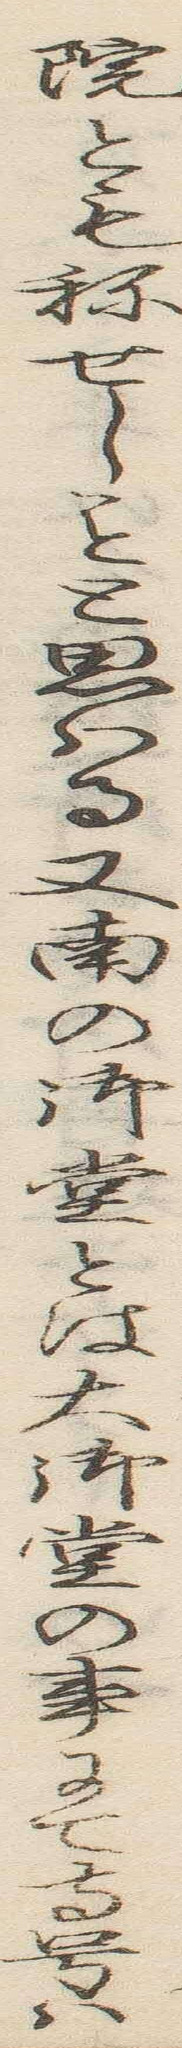院とも称せしことと思はる又南の御堂とは大御堂の事にて寺号は

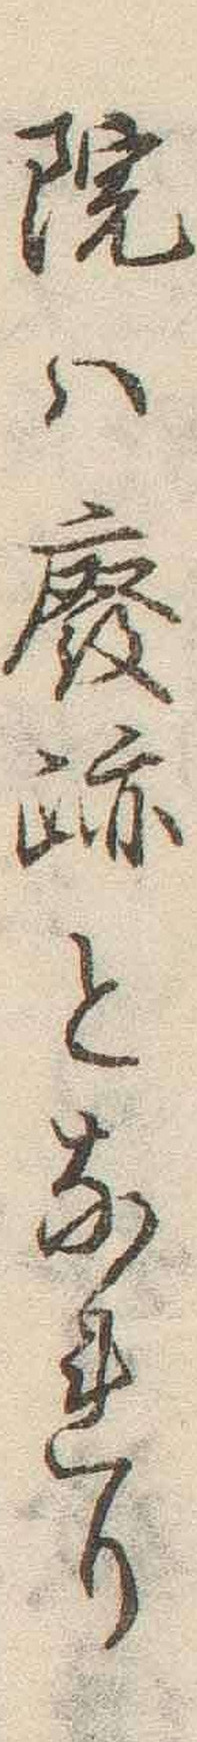院は廢跡となれり
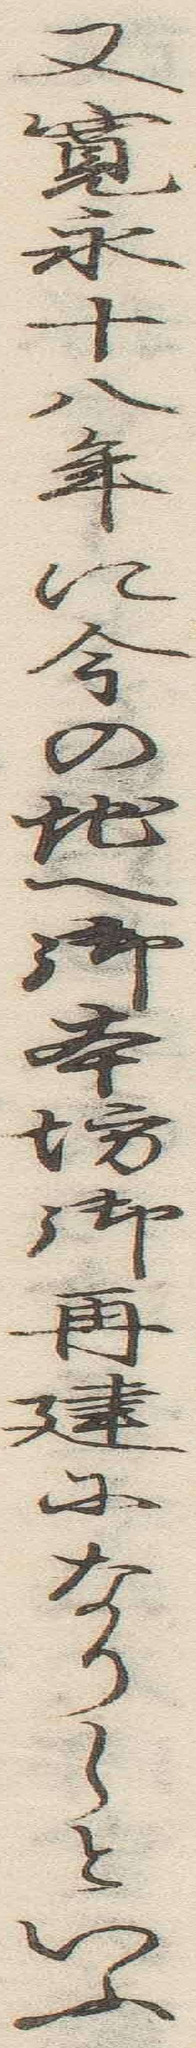又寛永十八年に今の地へ御本坊御再建になりしといふ
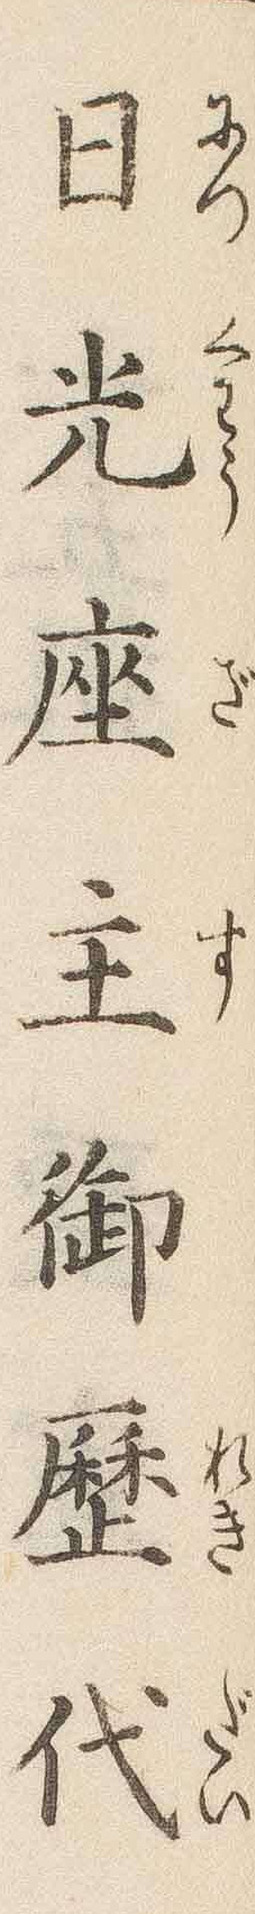日光座主御歷代
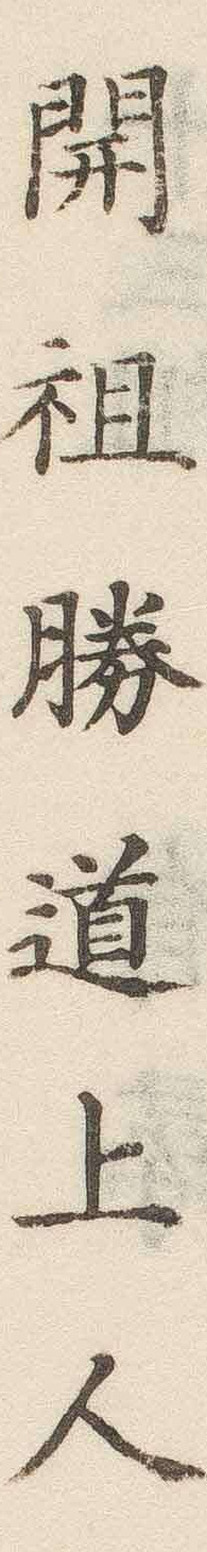開祖勝道上人
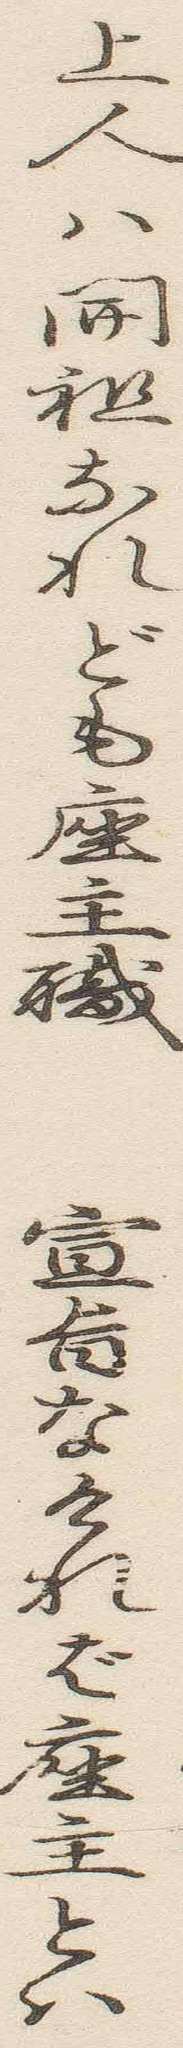上人は開祖なれども座主職宣旨なければ座主とは
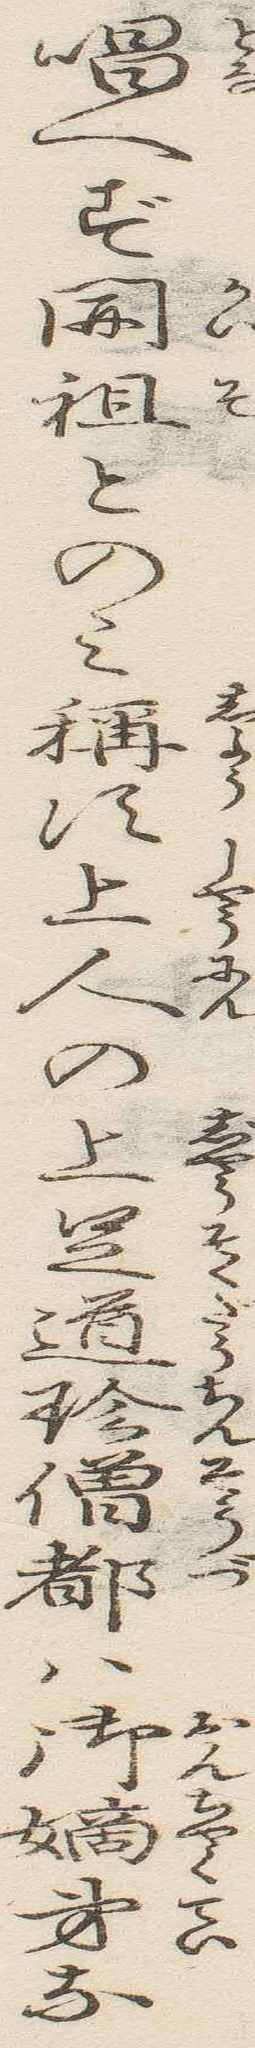唱へず開祖とのみ稱す上人の上足道珍僧都は御嫡㐧な
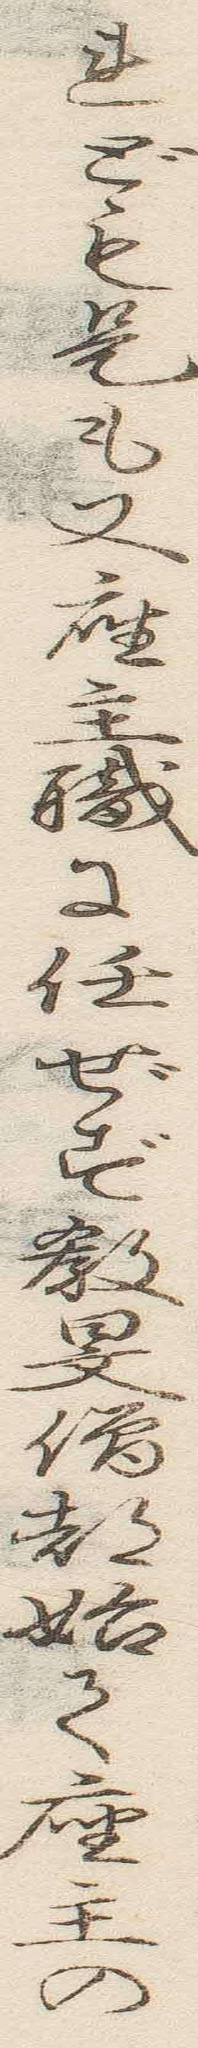れども是も又座主職に任ぜず敎旻僧都始て座主の
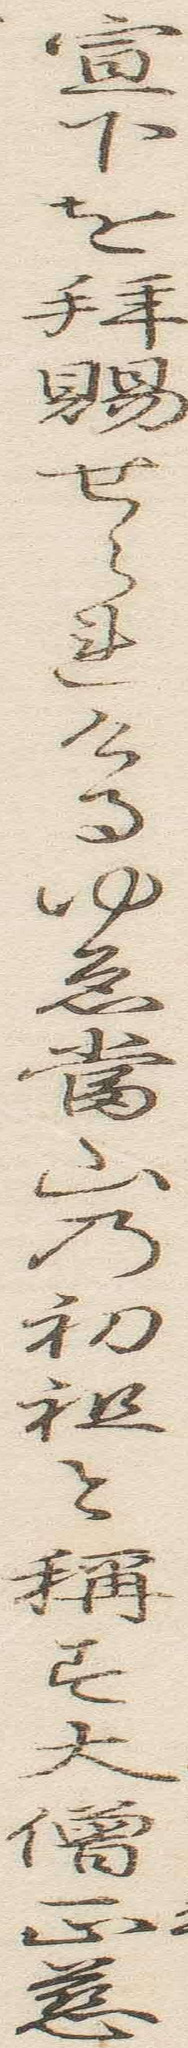宣下を拜賜せられけるゆゑ當山の初祖と稱す大僧正慈
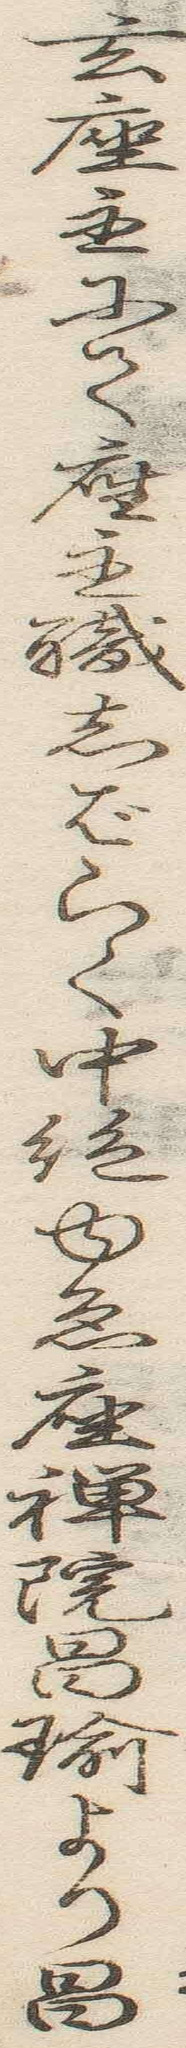玄座主にて座主職しばらく中絶ゆゑ座禅院昌瑜より昌
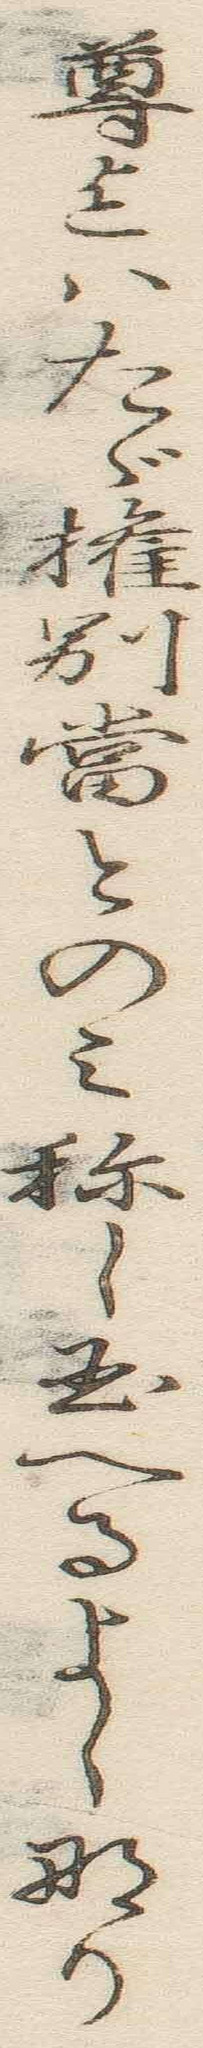尊迄はたゞ権別當とのみ称し玉へるよしなり

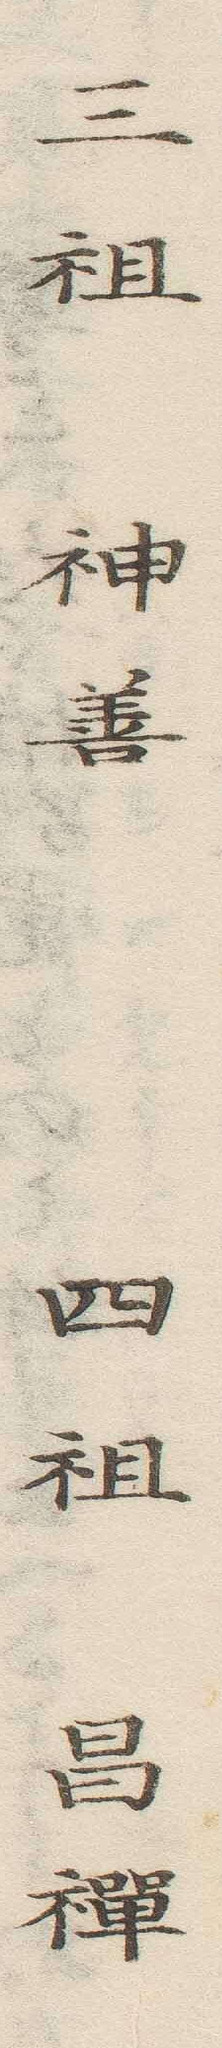三祖神善四祖昌禪
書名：日光山志
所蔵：東京学芸大学附属図書館 国文学研究資料館
